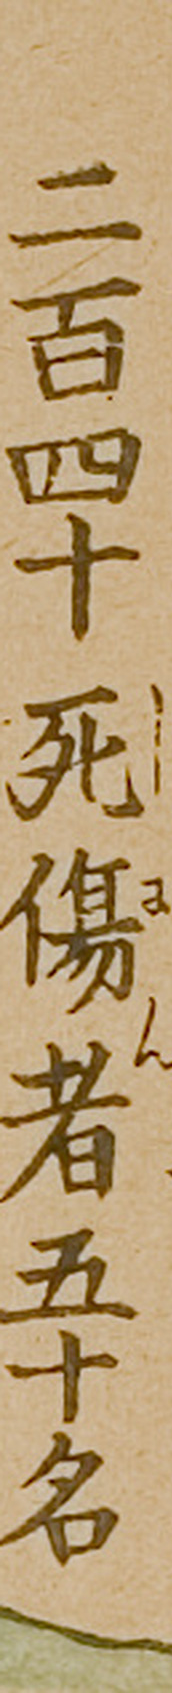二百四十死傷者五十名
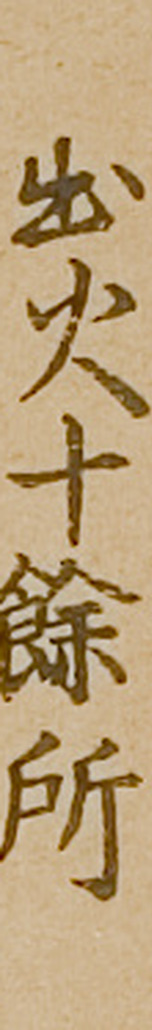出火十余所
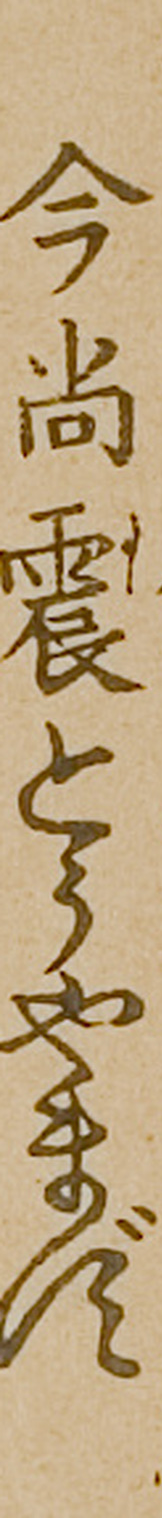今尚震とうやまず
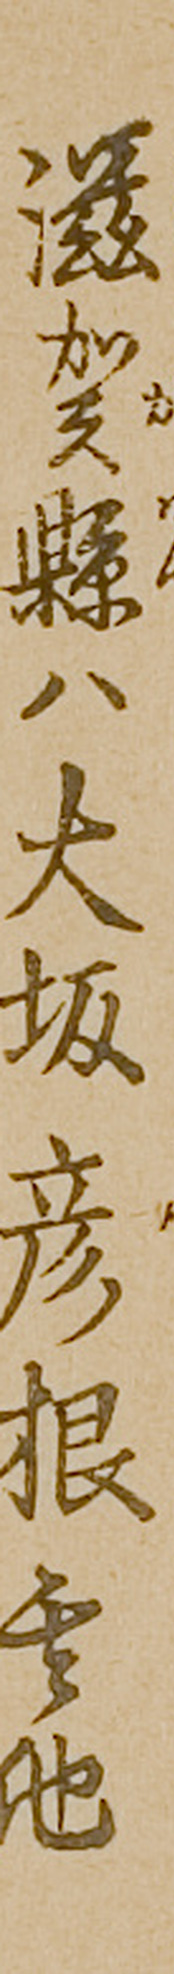滋賀県は大坂彦根其他
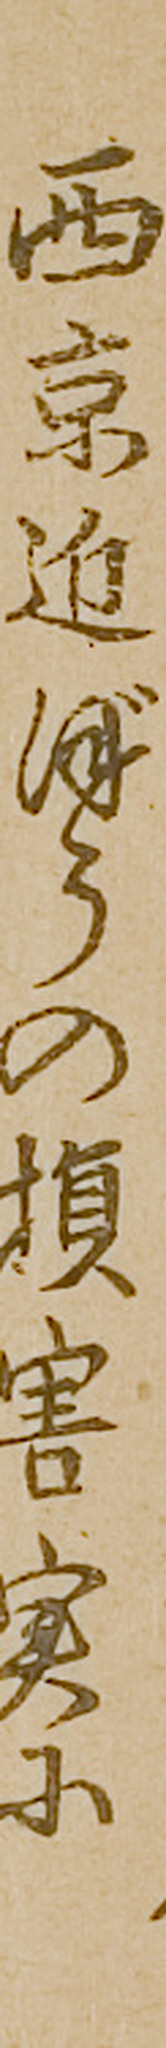西京近ぼうの損害実に
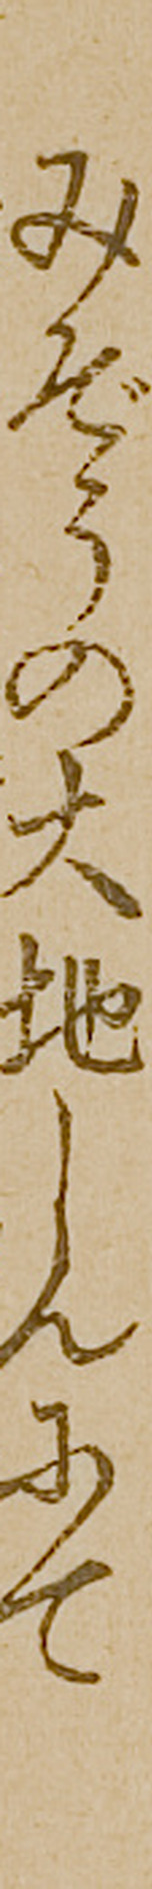みぞうの大地しんにて
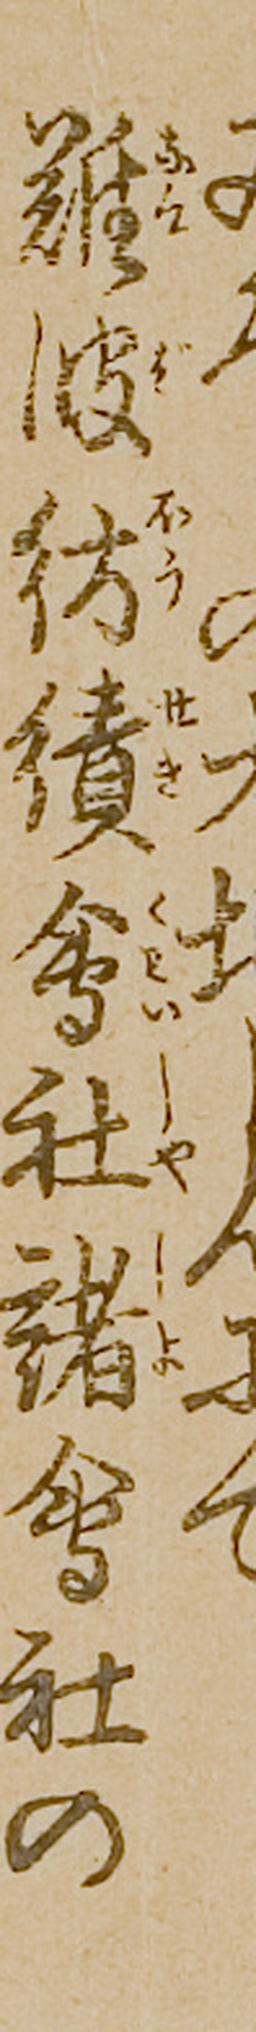難波紡績会社諸会社の
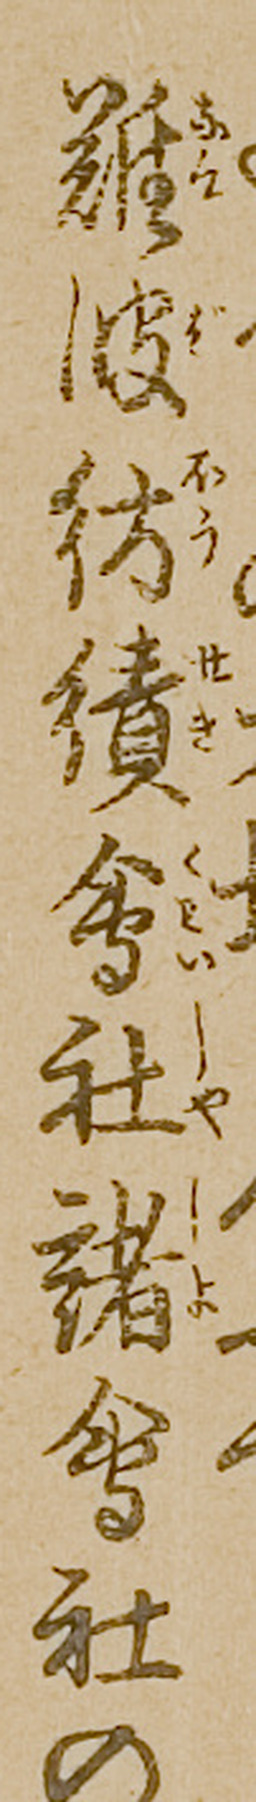難波紡績会社諸会社の
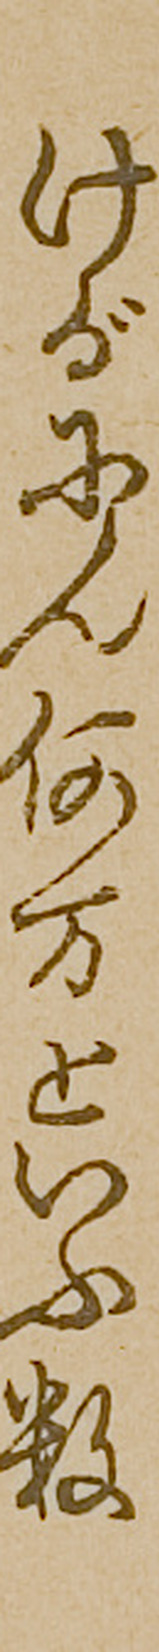けがにん何万といふ数
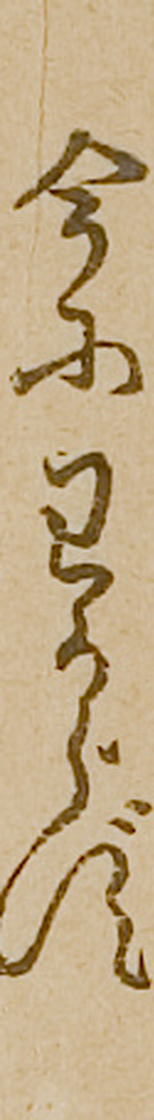今にわからず
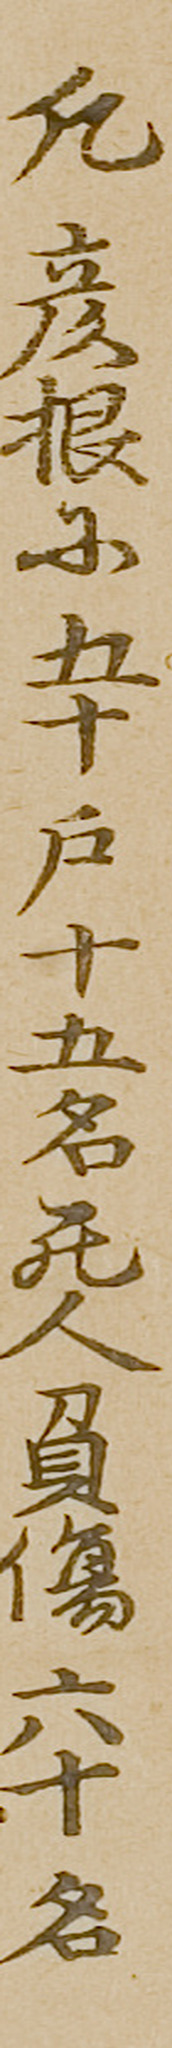凡彦根に五十戸十五名死人負傷六十名
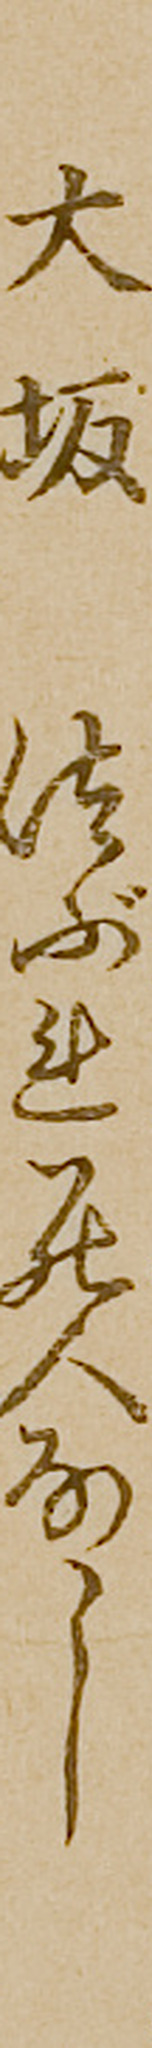大坂つぶれ死人なし
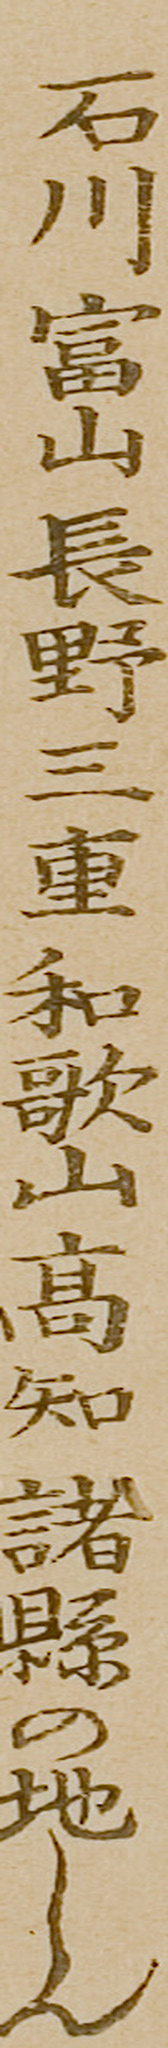石川富山長野三重和歌山高知諸県の地しん
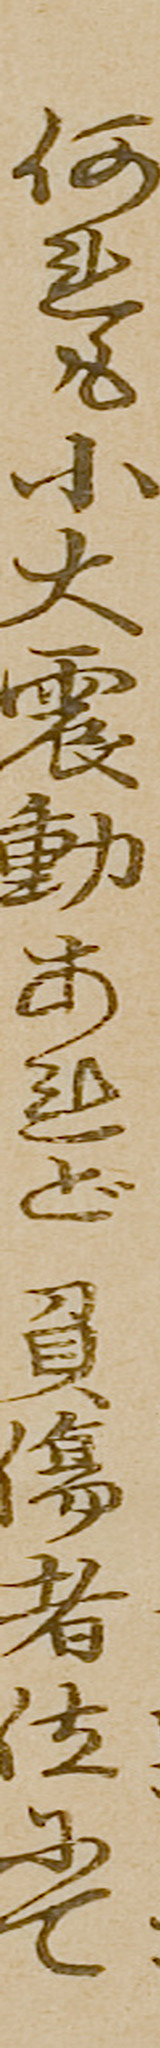何れも小大震動あれど負傷者位にて
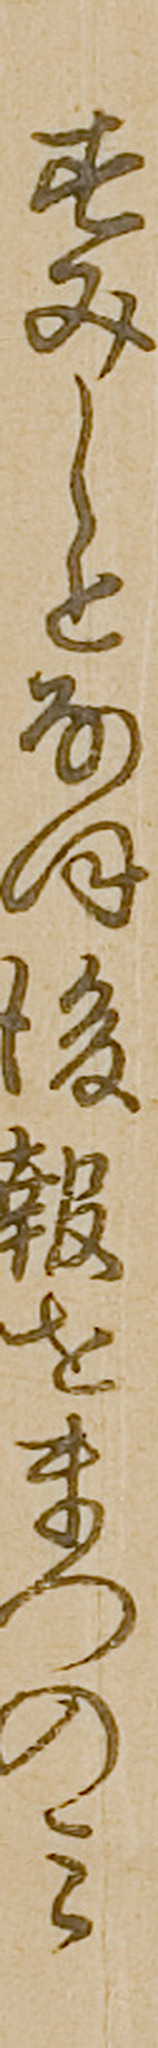すみしとなほ後報をまつのみ
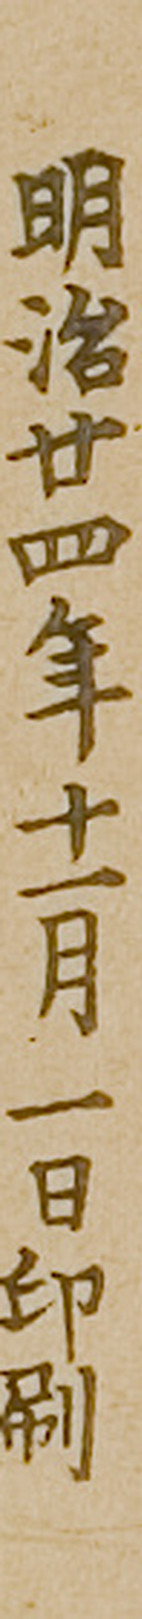明治廿四年十一月一日印刷
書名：愛知岐阜福井三県下大地震之図
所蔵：東京大学総合図書館 General Library in the University of Tokyo, JAPAN
